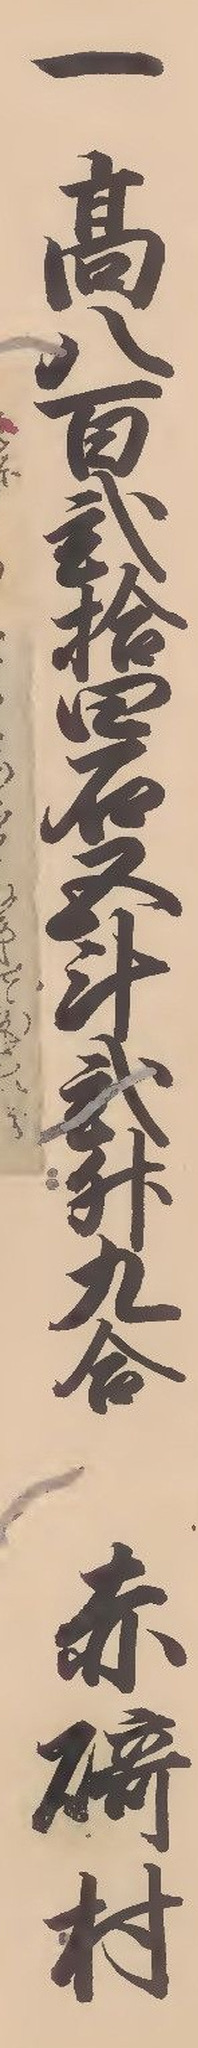一高八百弐拾四石五斗弐升九合赤崎村

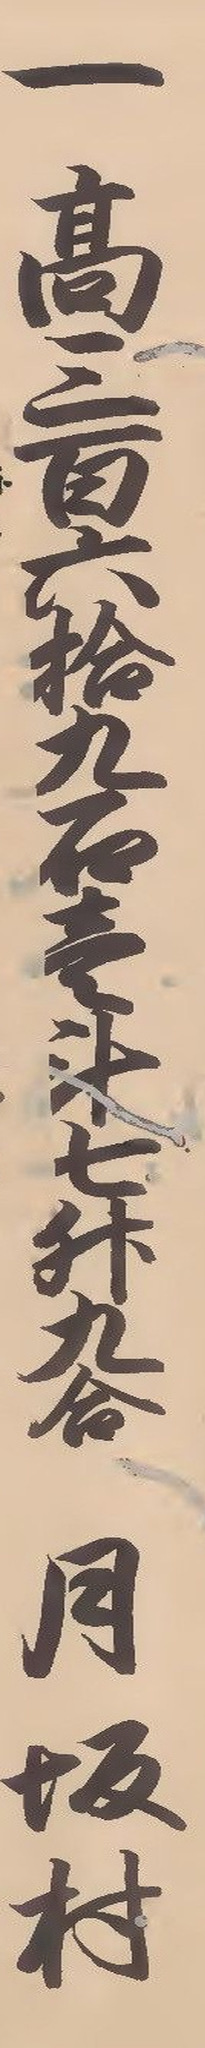一高三百六拾九石壱斗七升九合月坂村
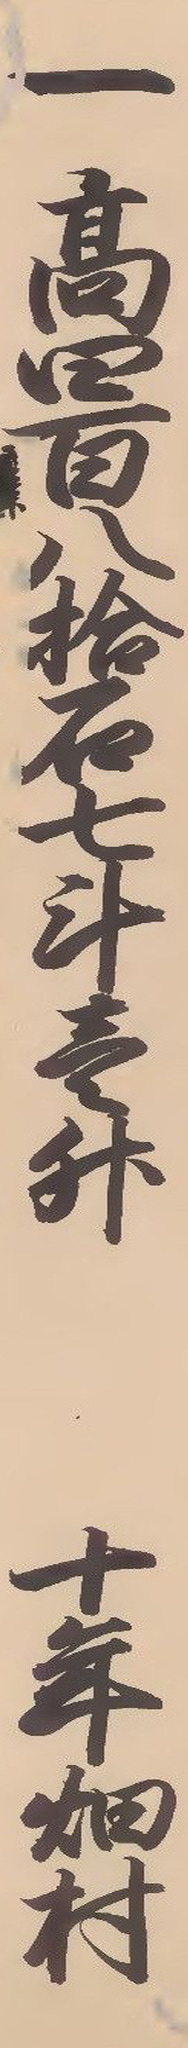一高四百八拾石七斗壱升十年畑村
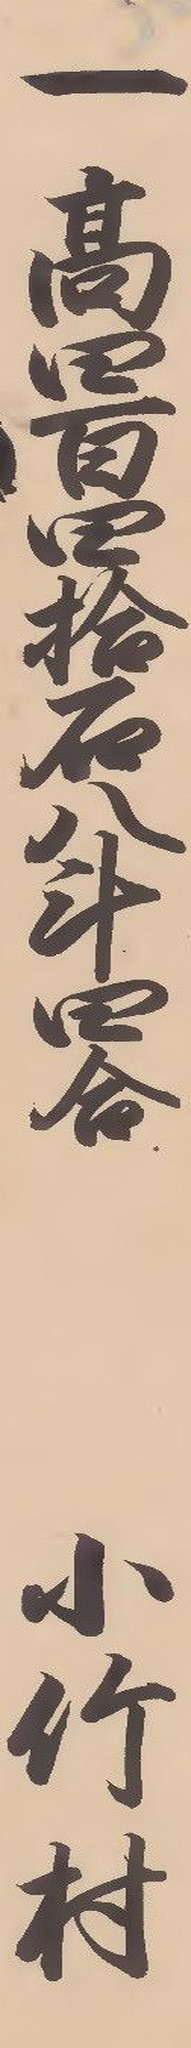一高四百四拾石八斗四合小竹村
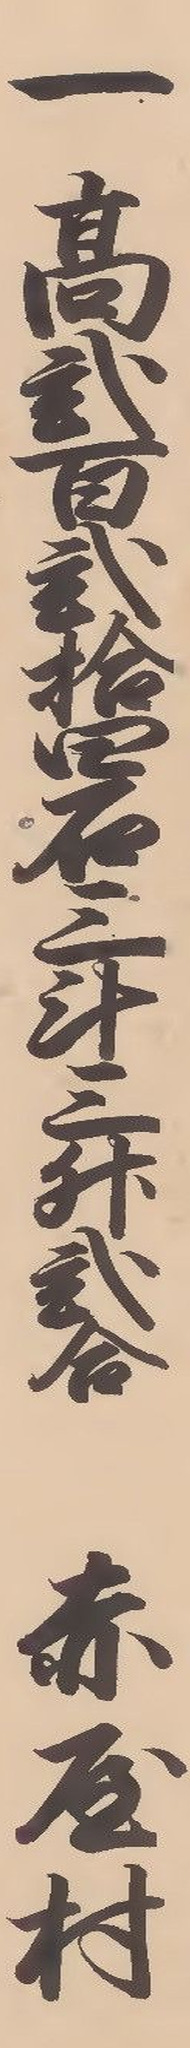一高弐百弐拾四石三斗三升弐合赤屋村
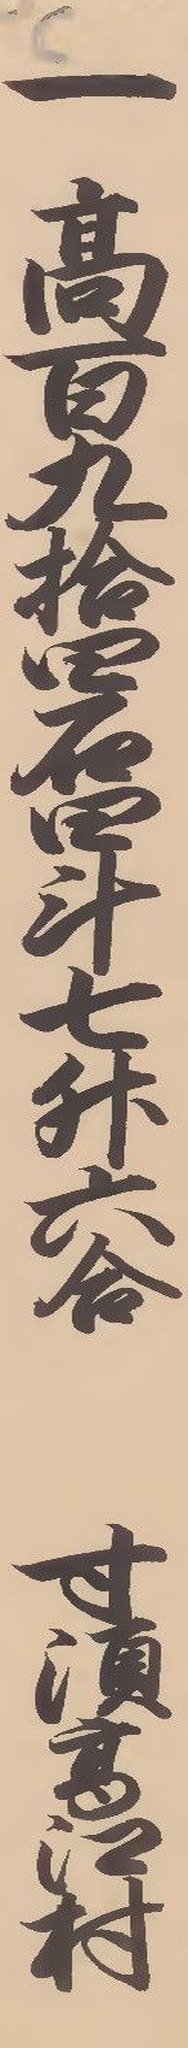一高百九拾四石四斗七升六合寸須高江村
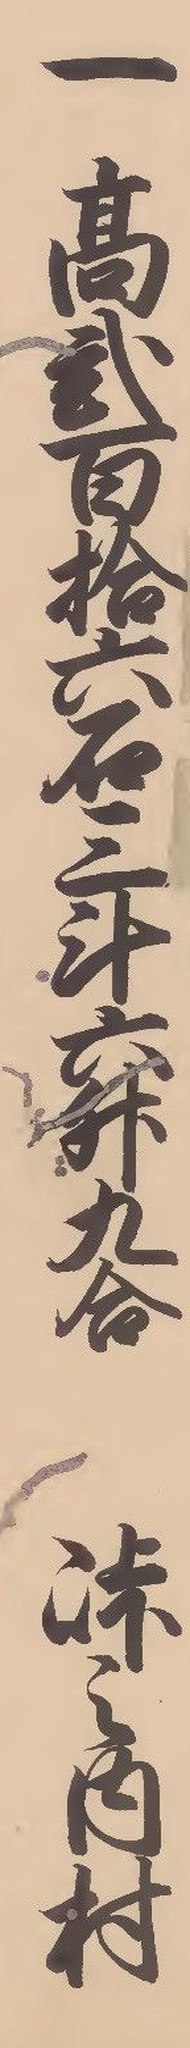一高弐百拾六石三斗六升九合峠之内村

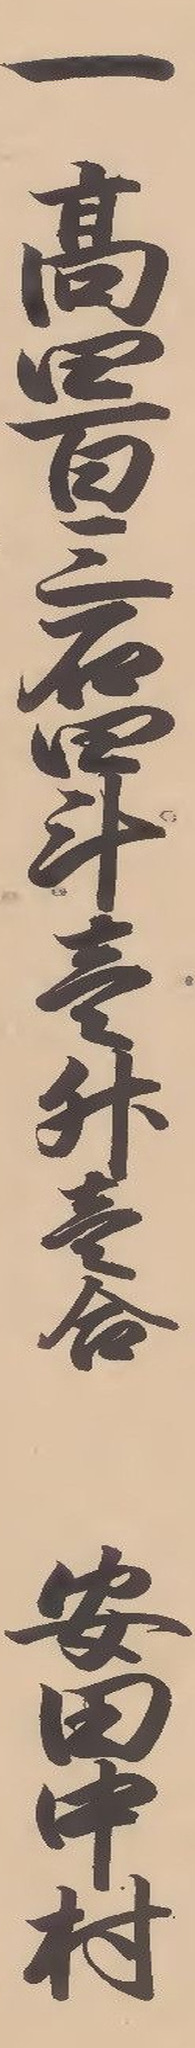一高四百三石四斗壱升壱合安田中村
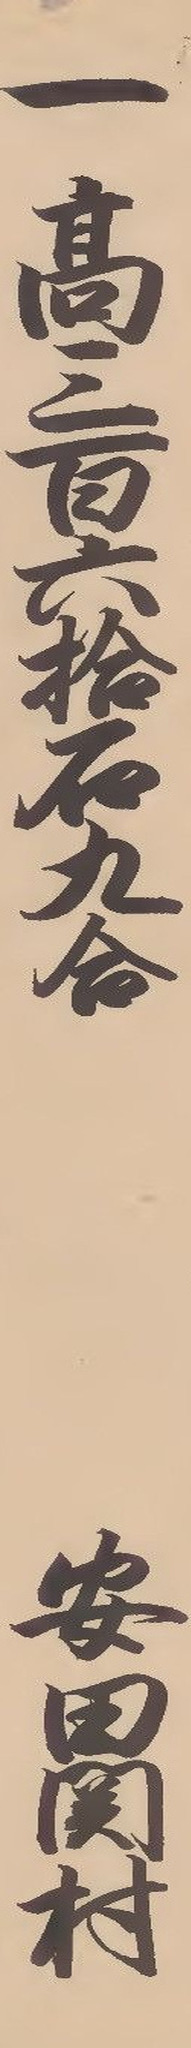一高三百六拾石九合安田関村
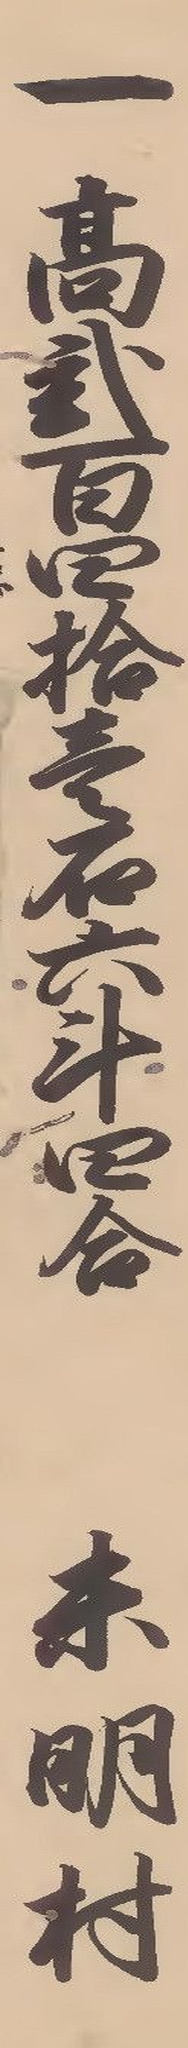一高弐百四拾壱石六斗四合未明村

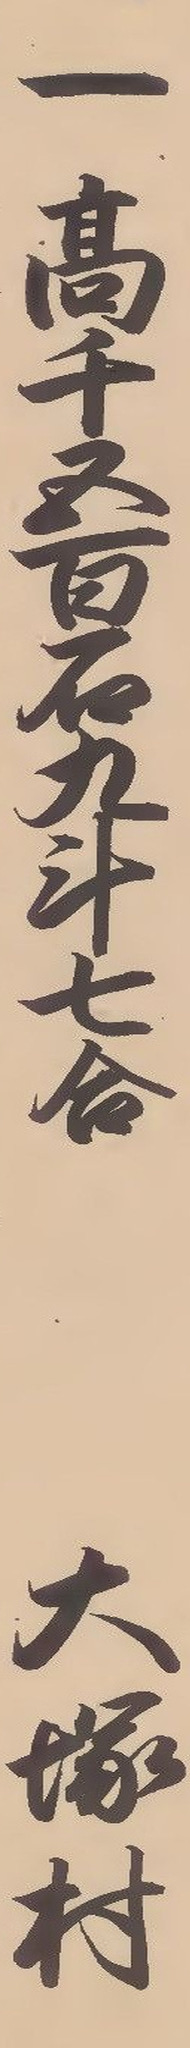一高千五百石九斗七合大塚村
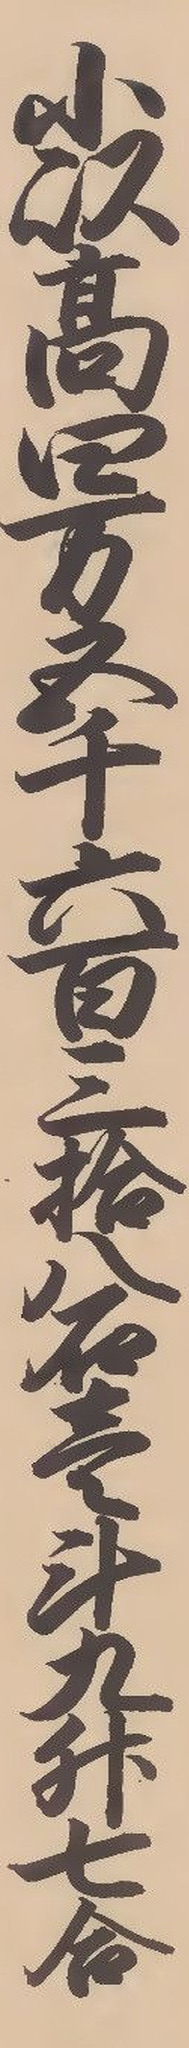小以高四万五千六百三拾八石壱斗九升七合
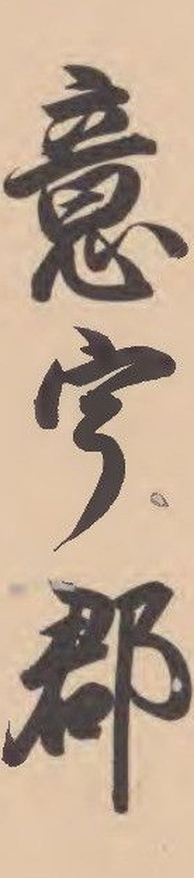意宇郡

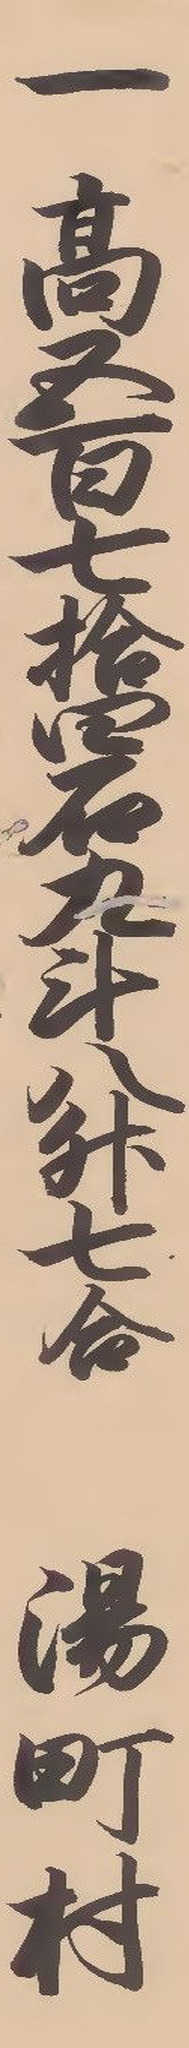一高五百七拾四石九斗八升七合湯町村

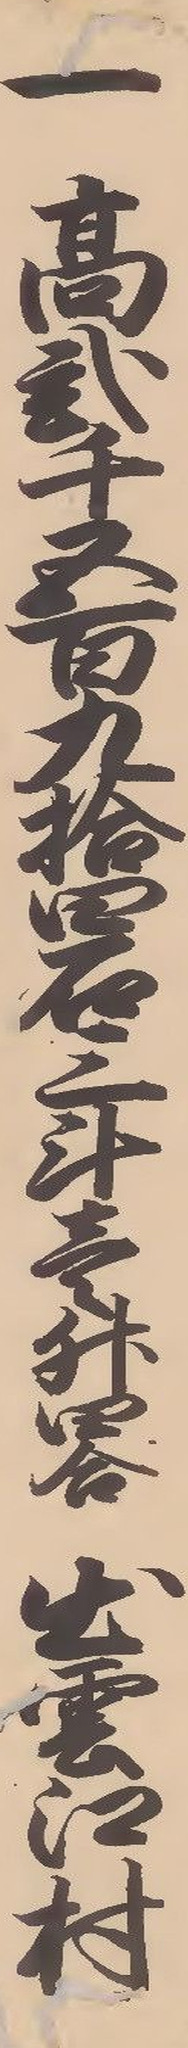一高弐千五百九拾四石三斗壱升四合出雲江村
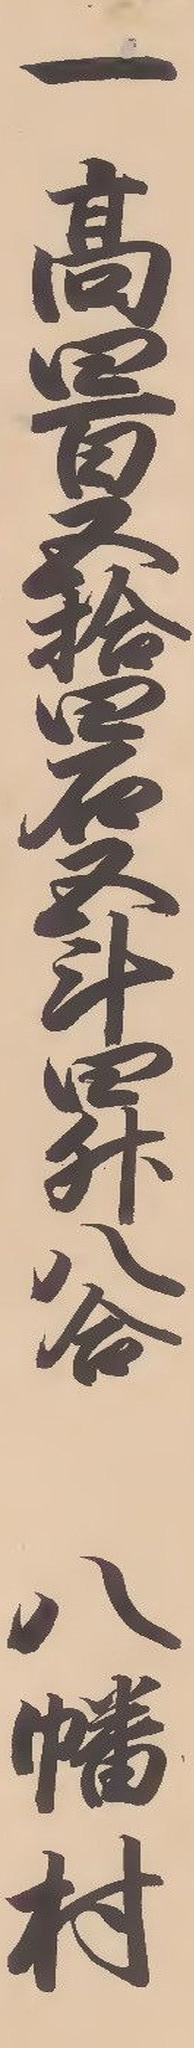一高四百五拾四石五斗四升八合八幡村
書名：出雲国郷帳
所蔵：国立公文書館 National Archives of Japan
